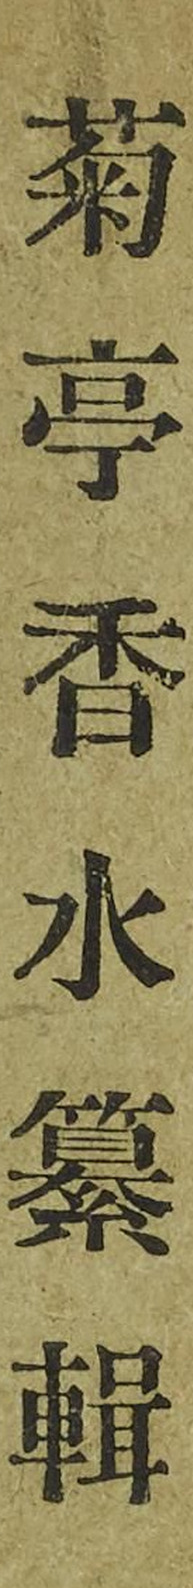菊亭香水纂輯
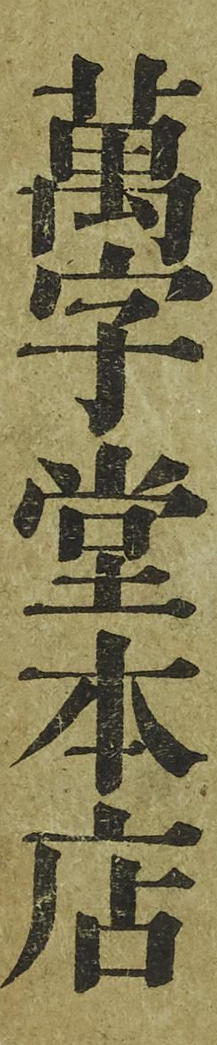萬字堂本店

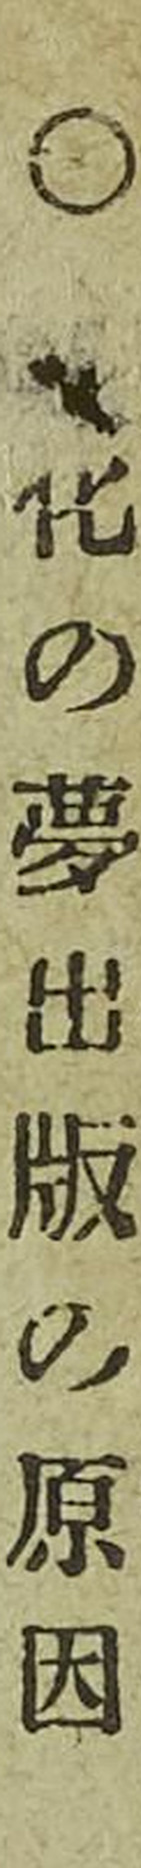○文化の夢出版の原因
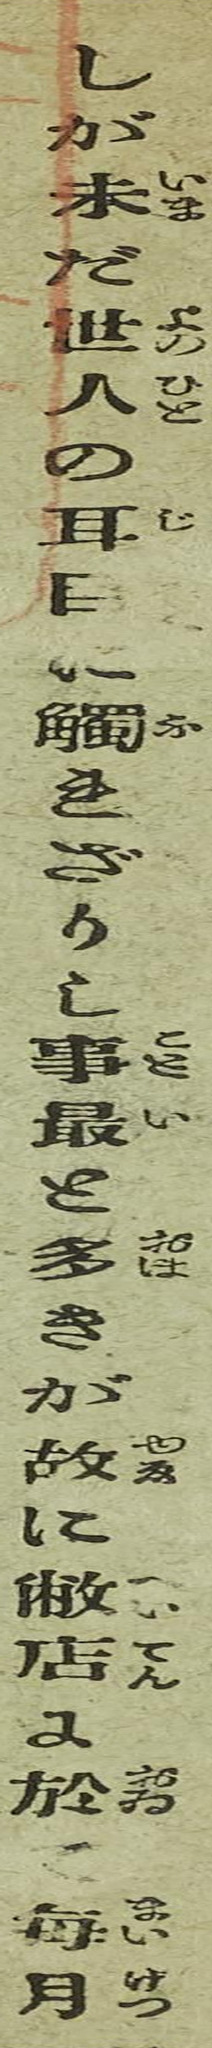しが未だ世人の耳目に触れざりし事最と多きが故に敝店に於て毎月
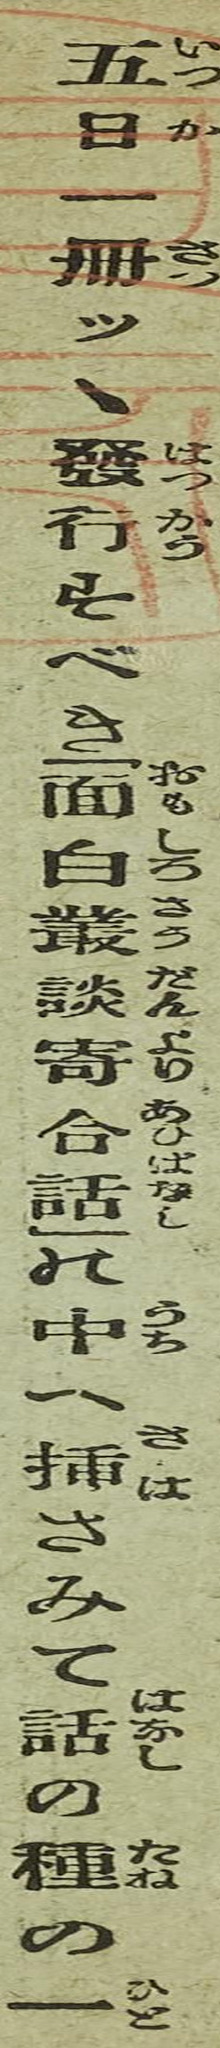五日一冊ツヽ発行すべき「面白叢談寄合話」の中へ挿さみて話の種の一
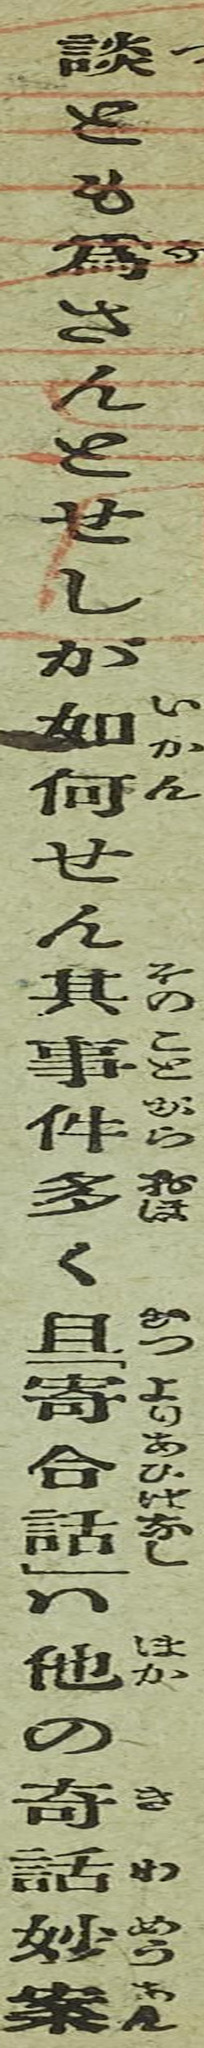談とも為さんとせしが如何せん其事件多く且「寄合話」は他の奇話妙案
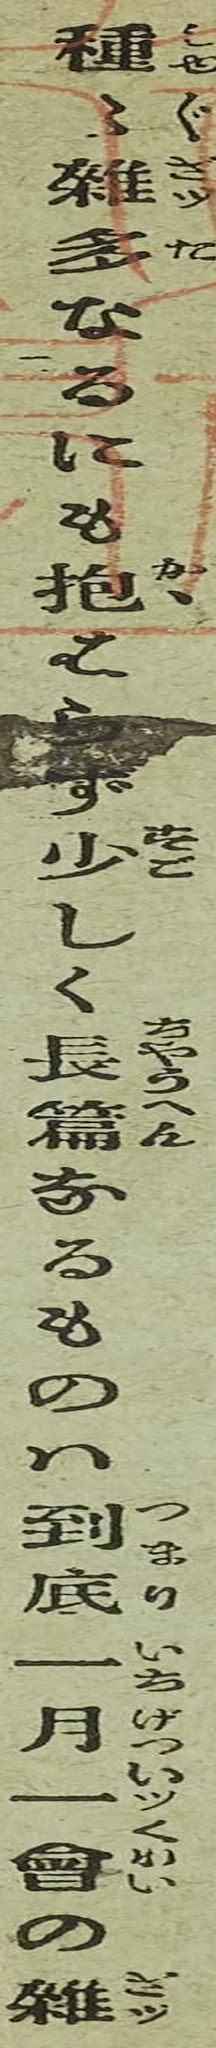種〻雑多なるにも抱はらず少しく長編なるものは到底一月一会の雑
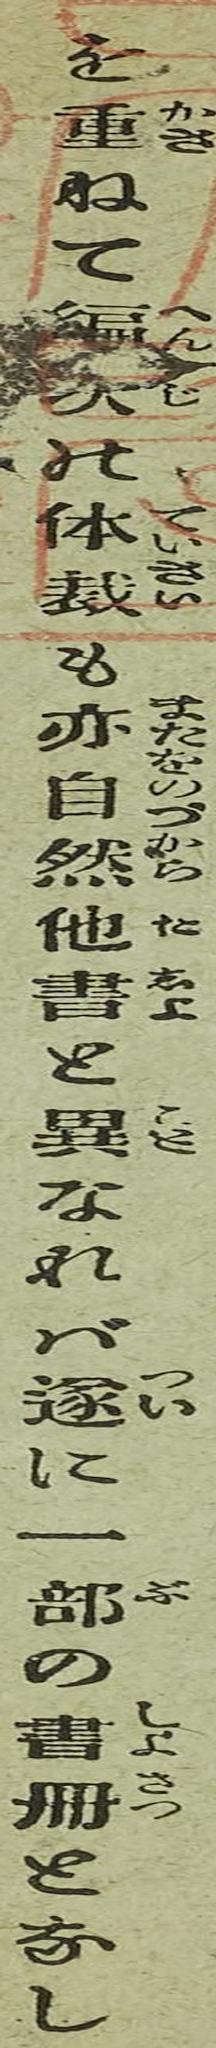を重ねて編次の体裁も亦自然他書と異なれば遂に一部の書冊となし
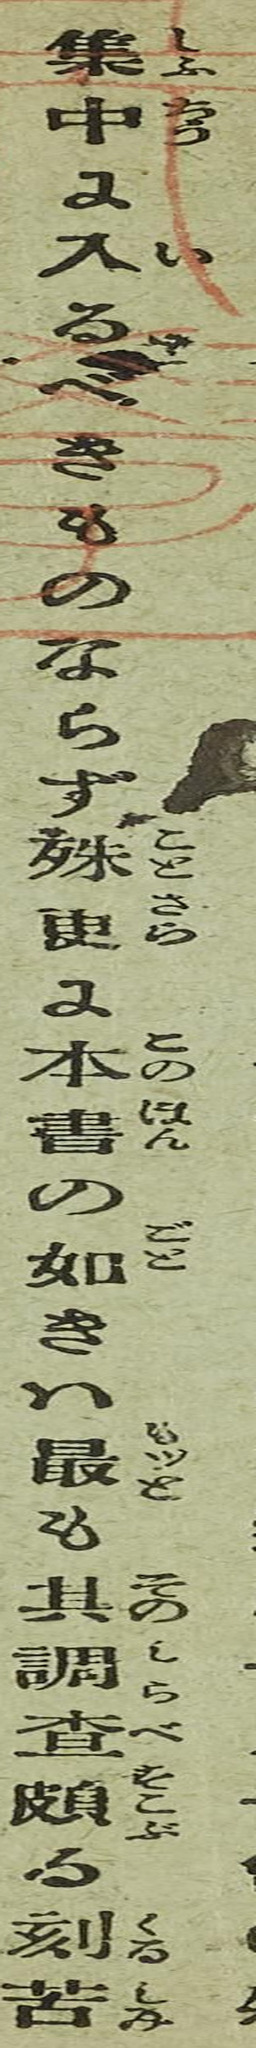集中に入るべきものならず殊更に本書の如きは最も其調査頗る刻苦
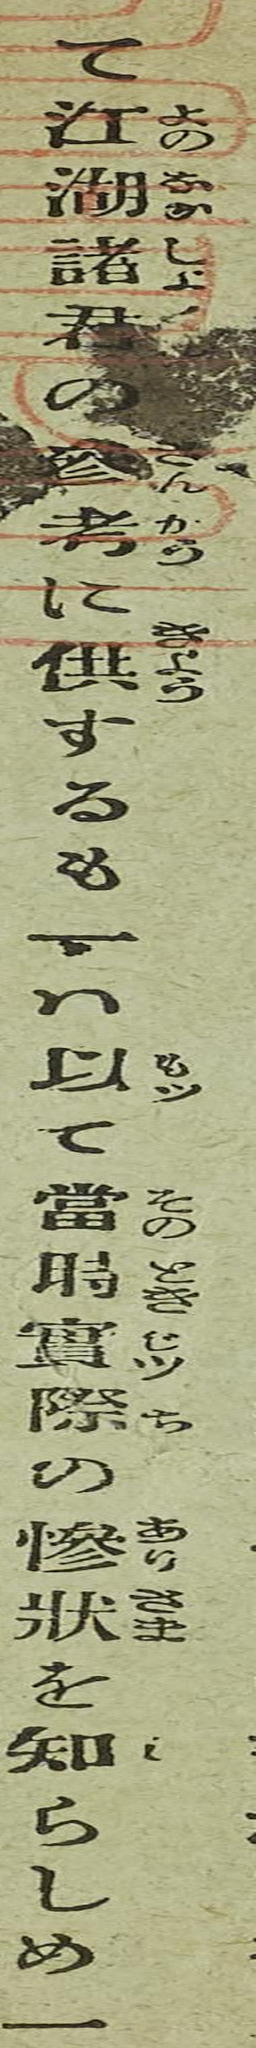て江湖諸君の参考に供するも一は以て当時実際の惨状を知らしめ一
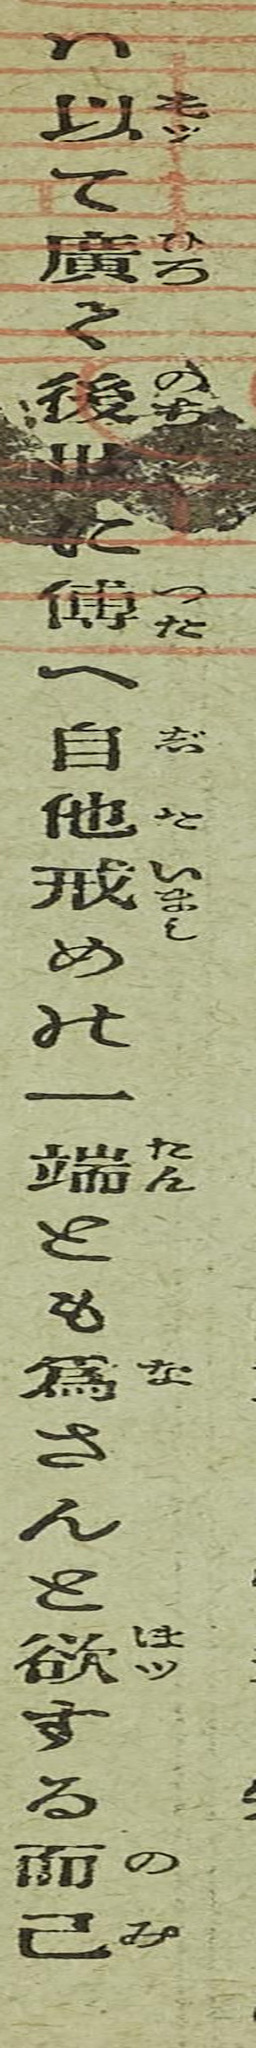は以て広く後世に伝へ自他戒めの一端とも為さんと欲する而已
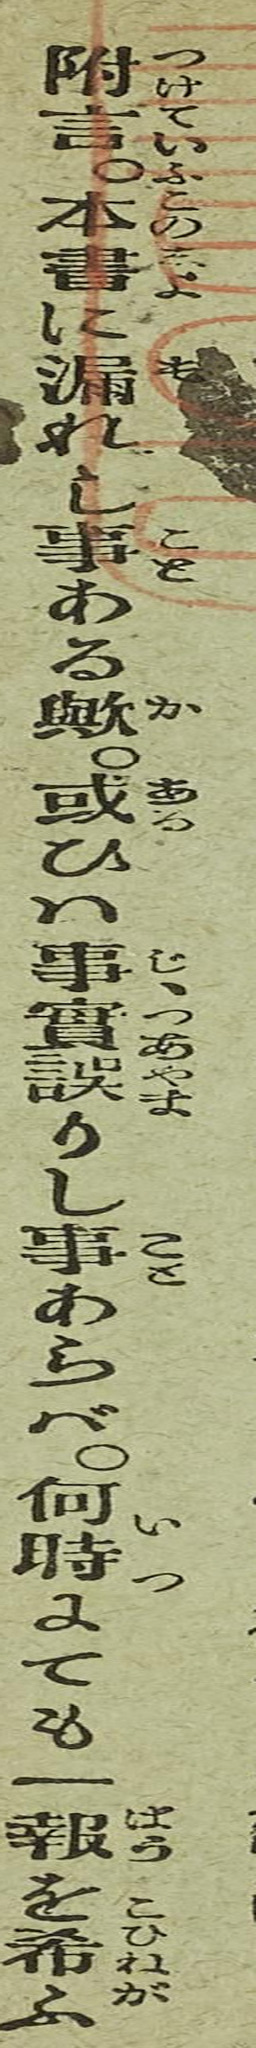附言。本書に漏れし事ある歟。或ひは事実誤りし事あらば。何時にても一報を希ふ
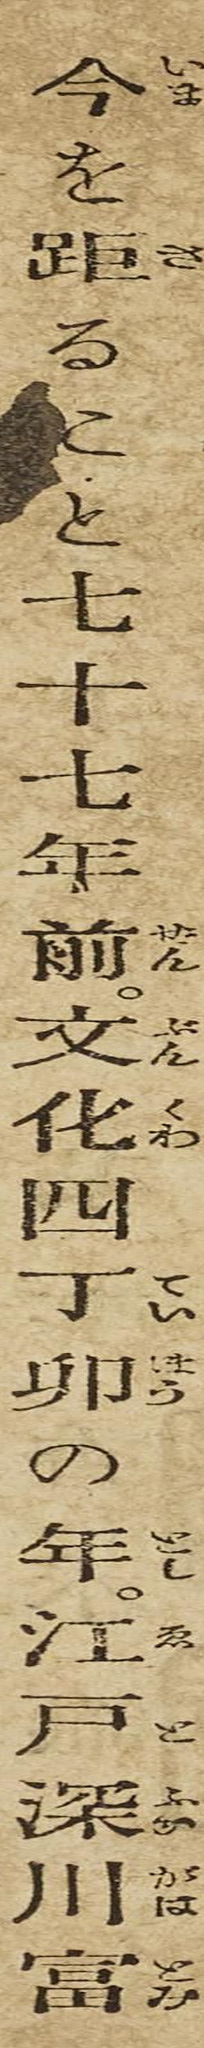今を距ること七十七年前。文化四丁卯の年。江戸深川富
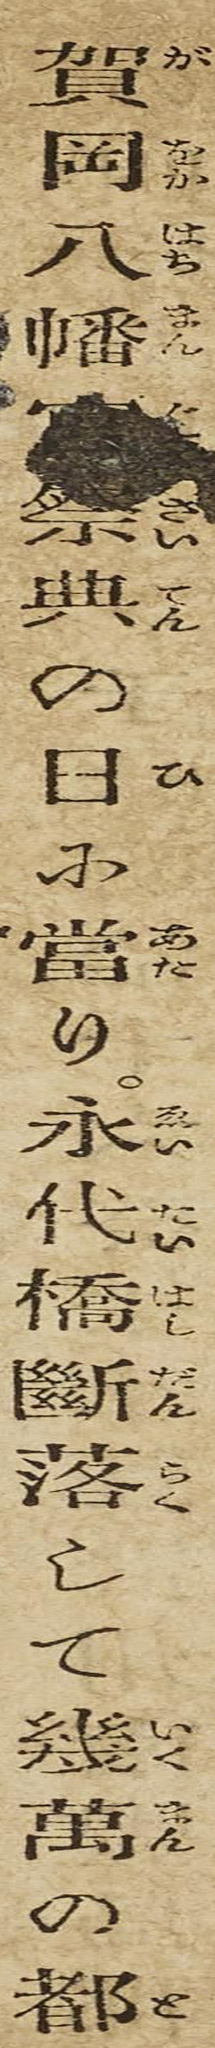賀丘八幡宮祭典の日に当り。永代橋断落して幾万の都
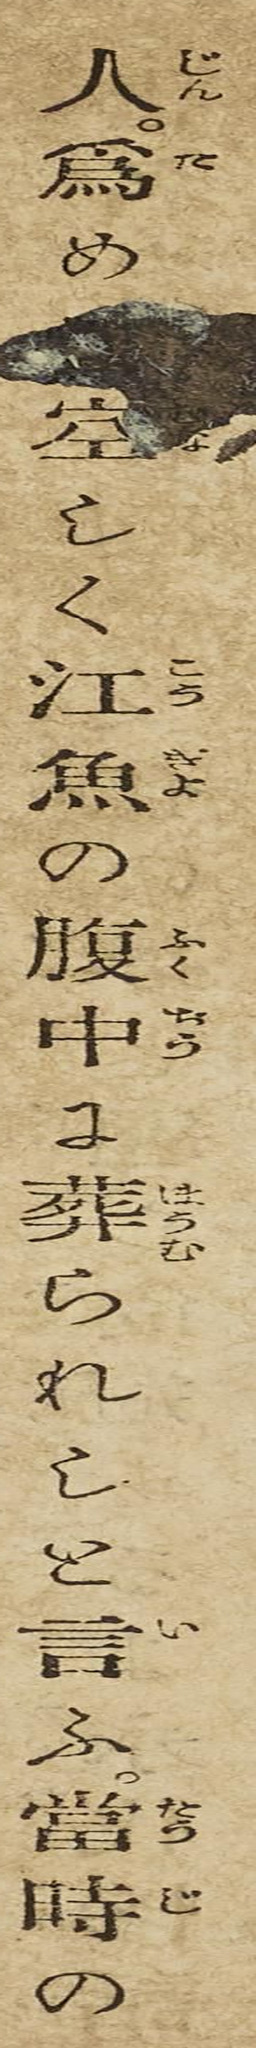人。為めに空しく江魚の腹中に葬られしと言ふ。当時の
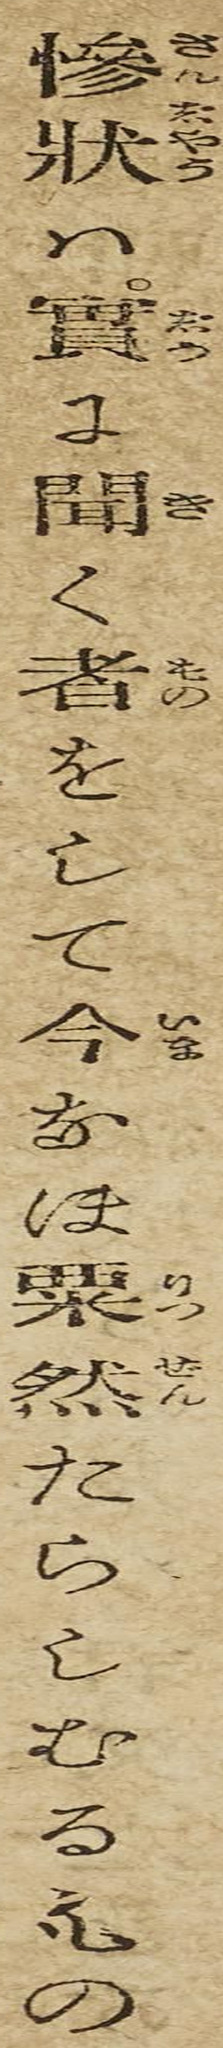惨状は。実に聞く者をして今なほ粟然たらしむるもの
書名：永代惨話　文化の夢　全
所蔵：東京大学地震研究所図書室 Earthquake Research Institute Library, The University of Tokyo, JAPAN
